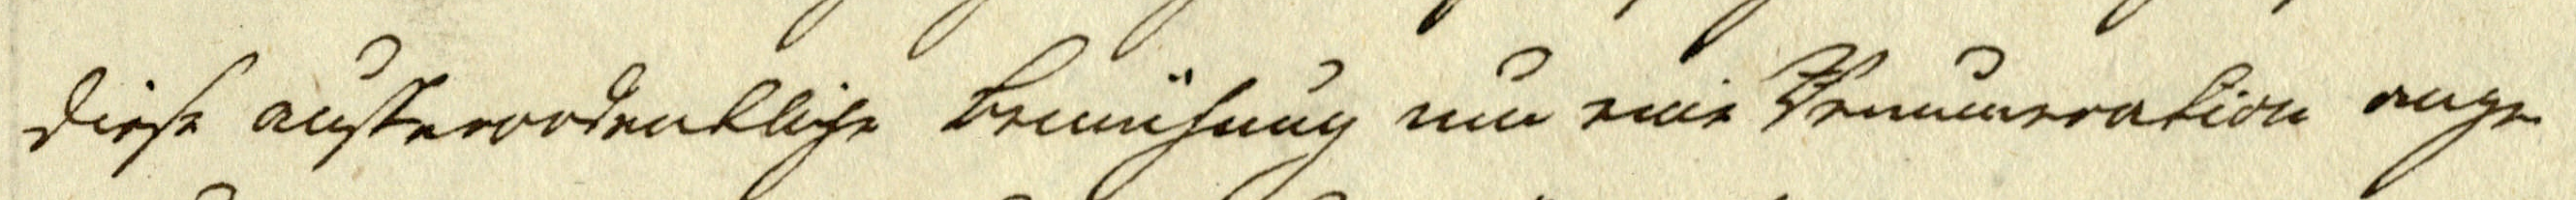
diese außerordentliche Bemühung um eine Remuneration ange¬
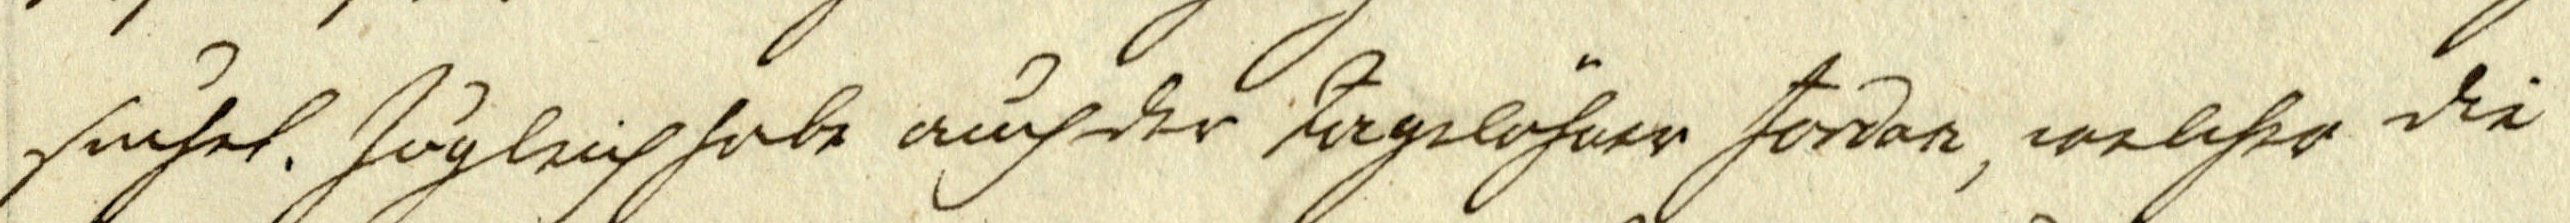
suchet. Zugleich habe auch der Tagelöhner Jordan, welcher die
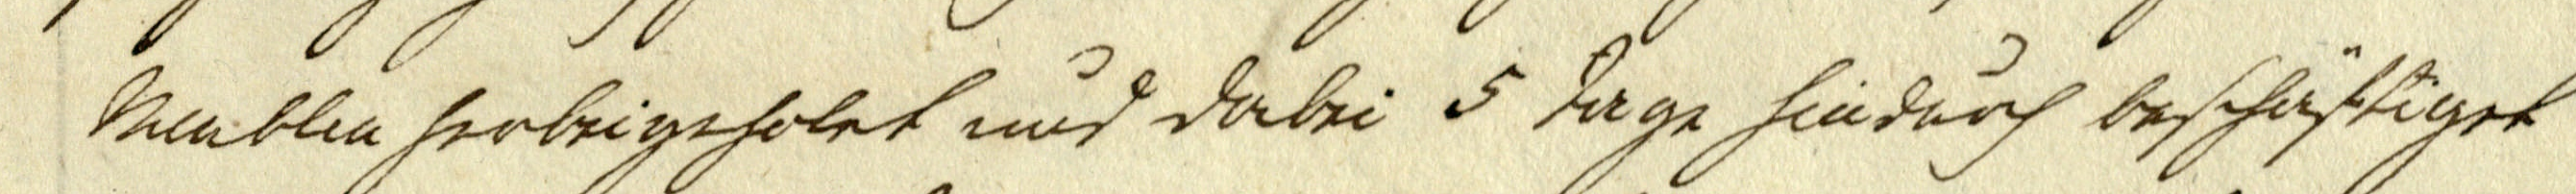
Meublen herbeigeholet und dabei 5 Tage hindurch beschäftiget
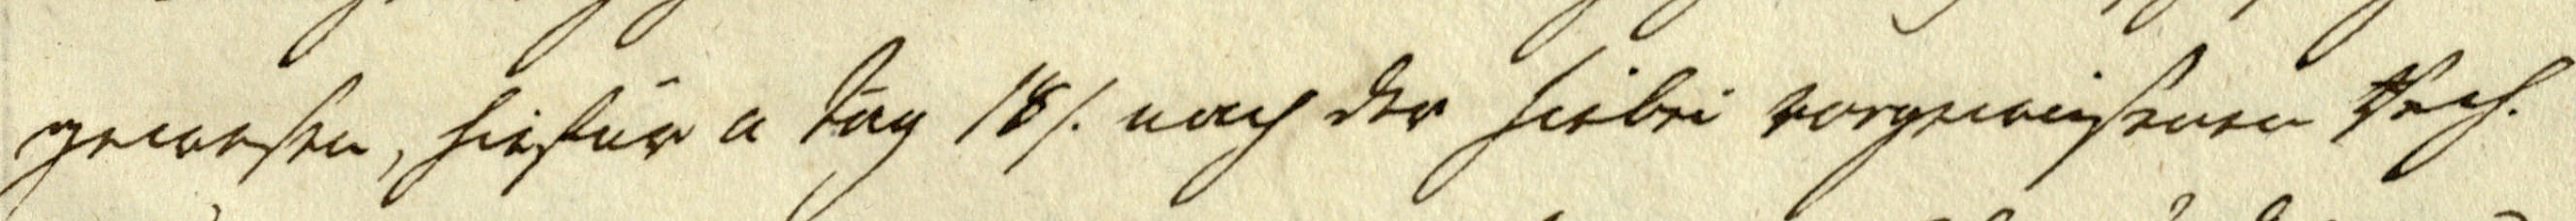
gewesen, hiefür a Tag 18 s. nach der hiebei vorgewiesenen Rech¬
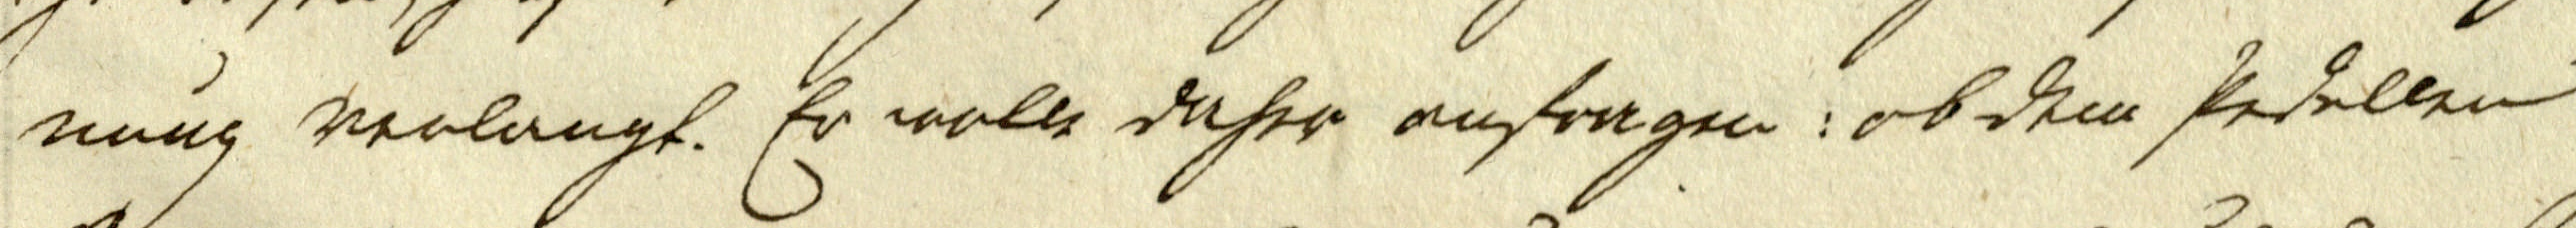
nung verlangt. Er wolle daher anfragen: ob dem Pedellen
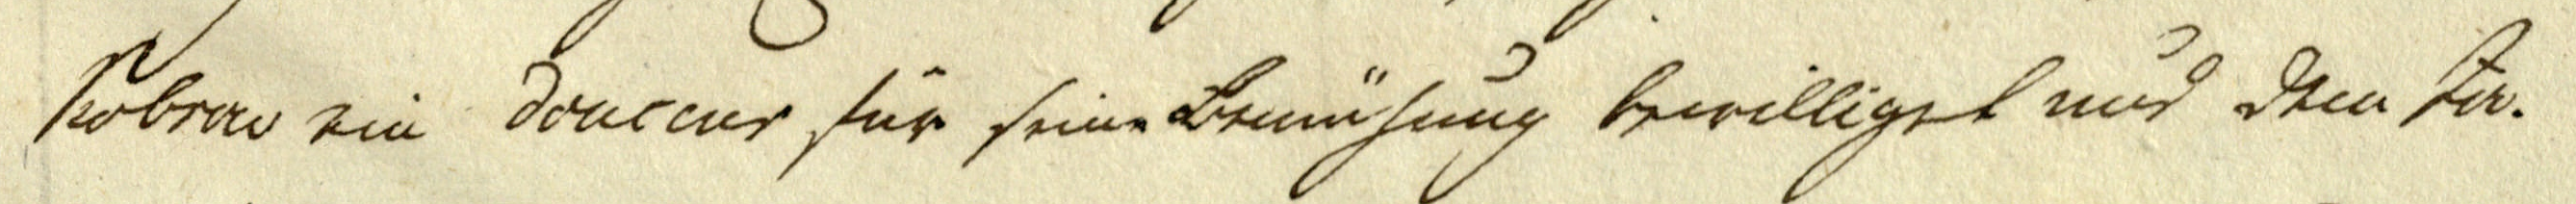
Kobrow ein douceur für seine Bemühung bewilliget und dem Ta¬
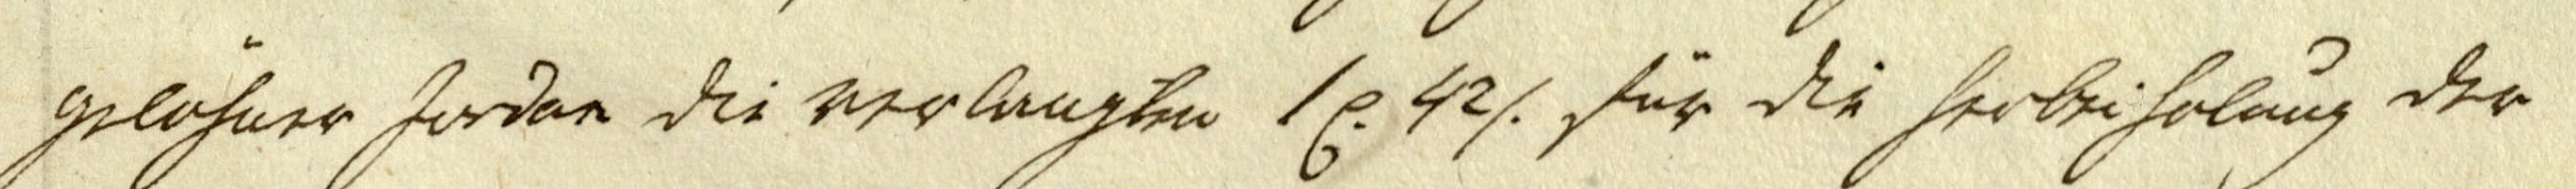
gelöhner Jordan die verlangten 1l. 42 s. für die herbeiholung der
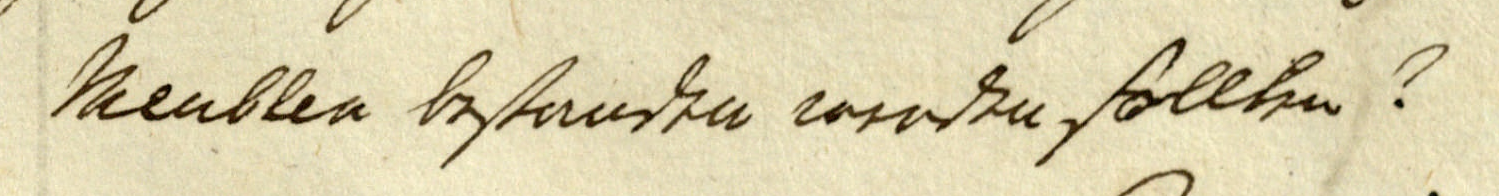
Meublen bestanden werden sollen?
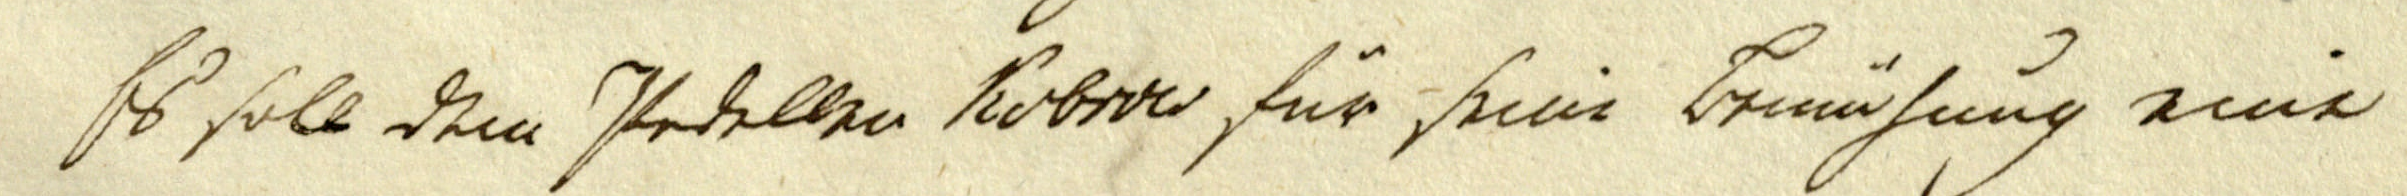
Es soll dem Pedellen Kobrow für seine Bemühung eine
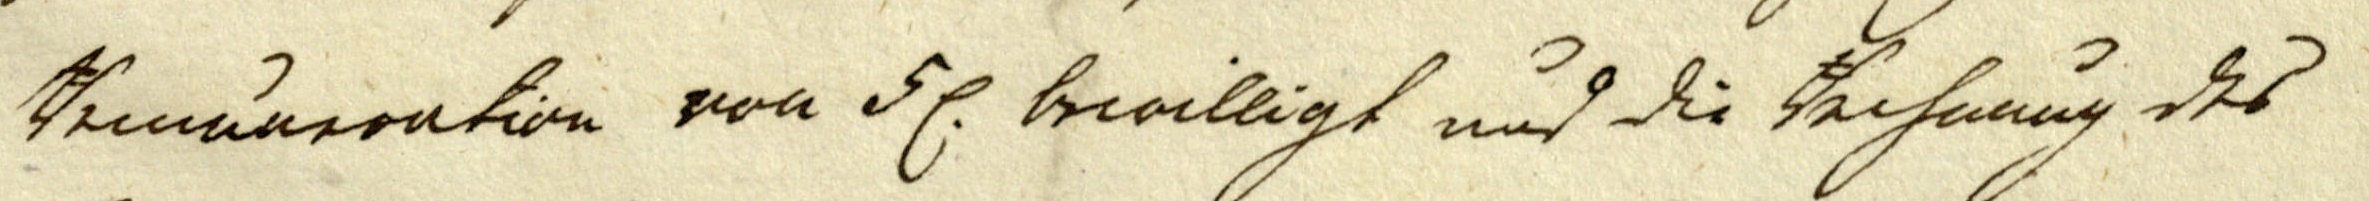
Remuneration von 5 l. bewilligt und die Rechnung des
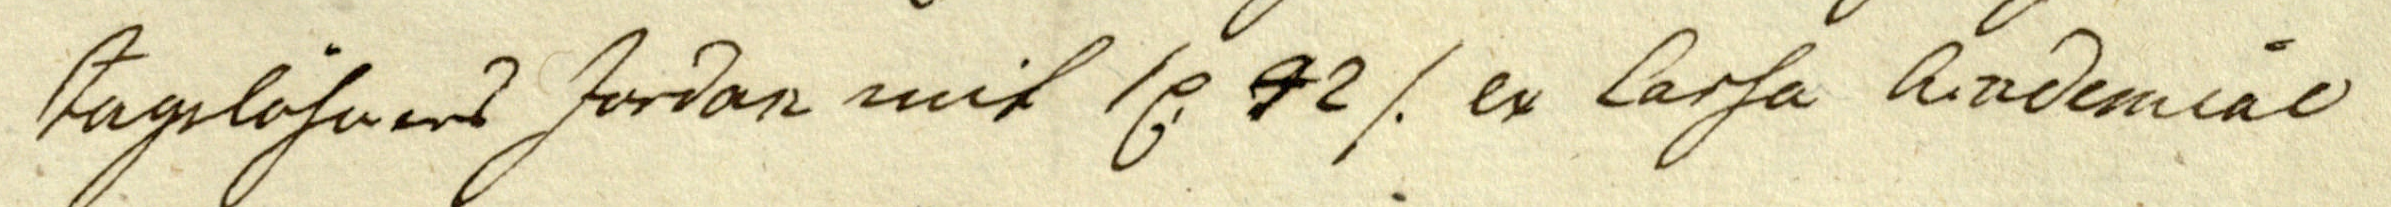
Tagelöhners Jordan mit 1 l. 42 s. ex Cassa Academiae
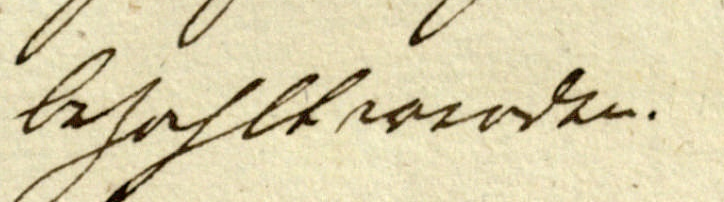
bezahlt werden.
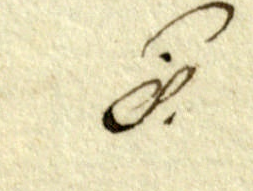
8.
